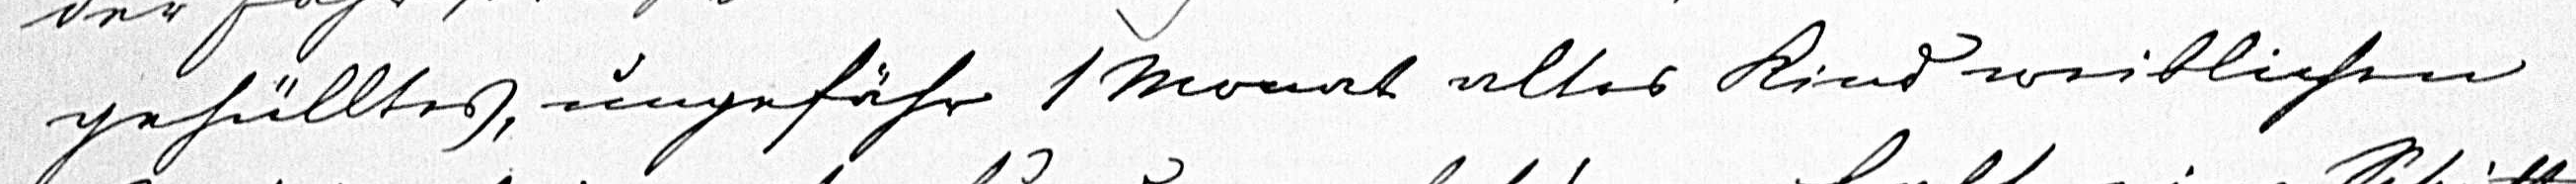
gehülltes, ungefähr 1 Monat altes Kind weiblichen
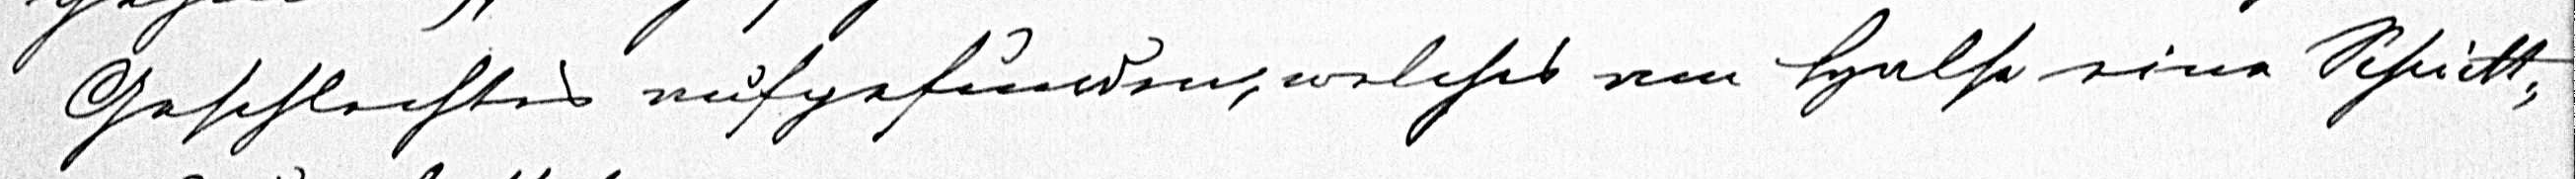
Geschlechtes aufgefunden, welches am Halse eine Schnitt¬
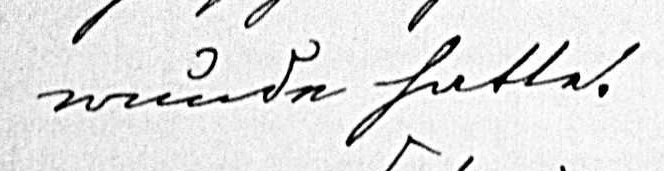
wunde hatte.
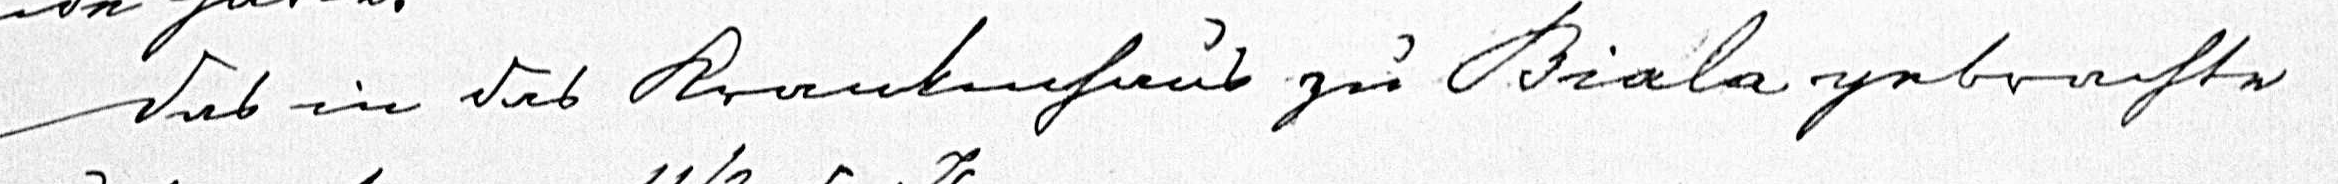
Das in das Krankenhaus zu Biala gebrachte
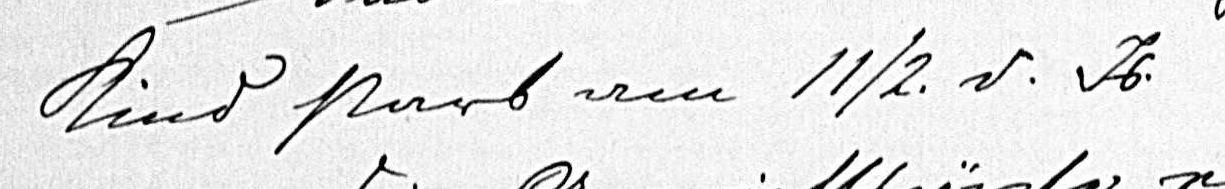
Kind starb am 11/2 d. Js.
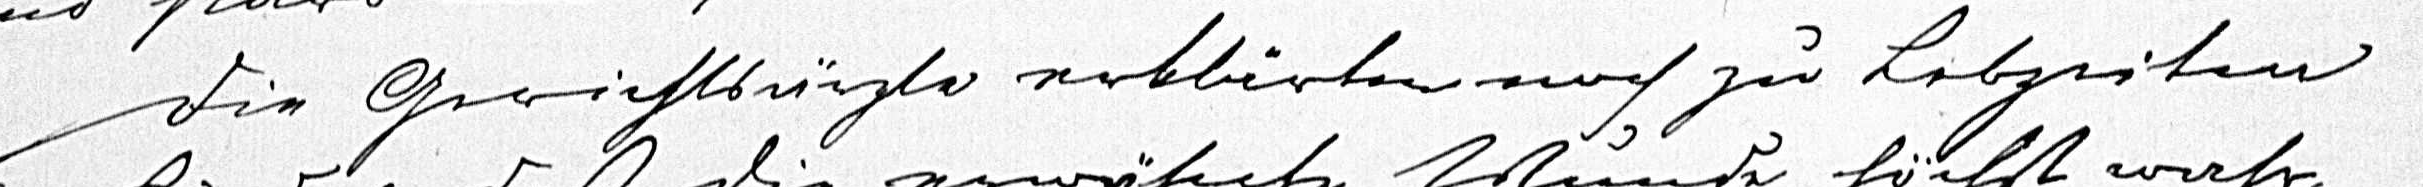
Die Gerichtsärzte erklärten noch zu Lebzeiten
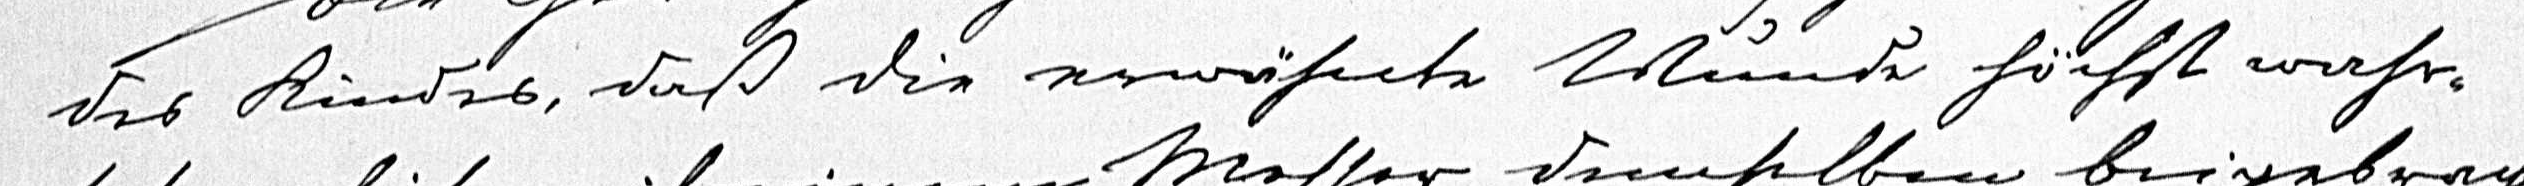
des Kindes, daß die erwähnte Wunde höchst wahr¬
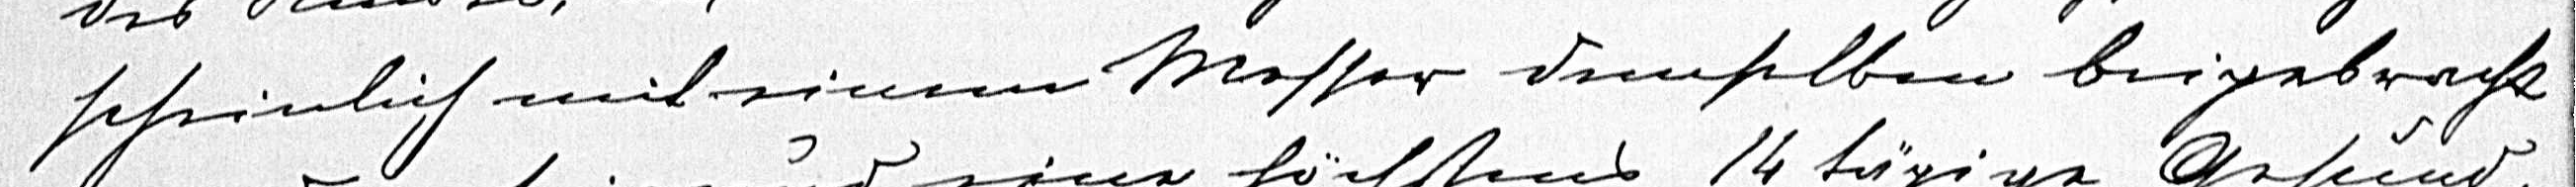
scheinlich mit einem Messer demselben beigebracht
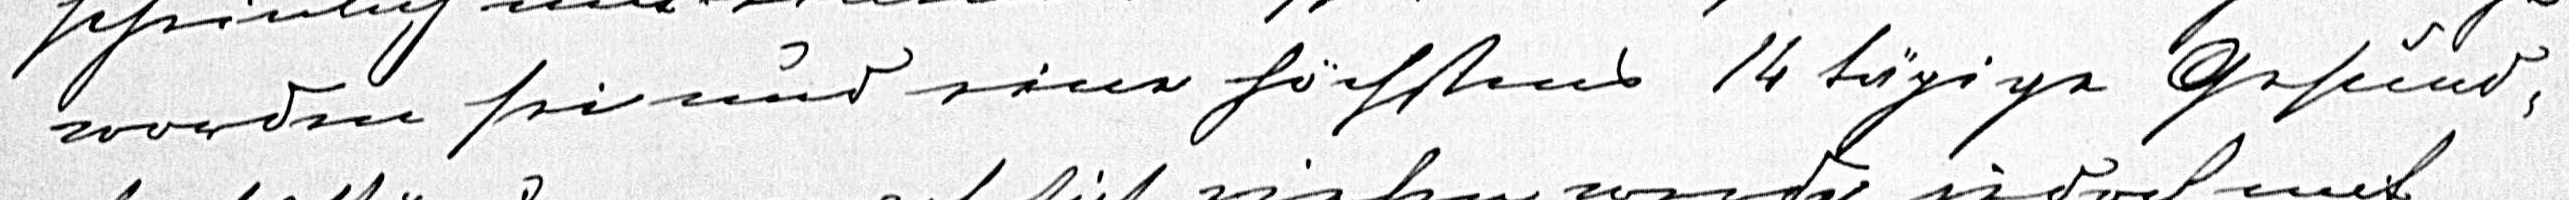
worden sei und eine höchstens 14tägige Gesund¬
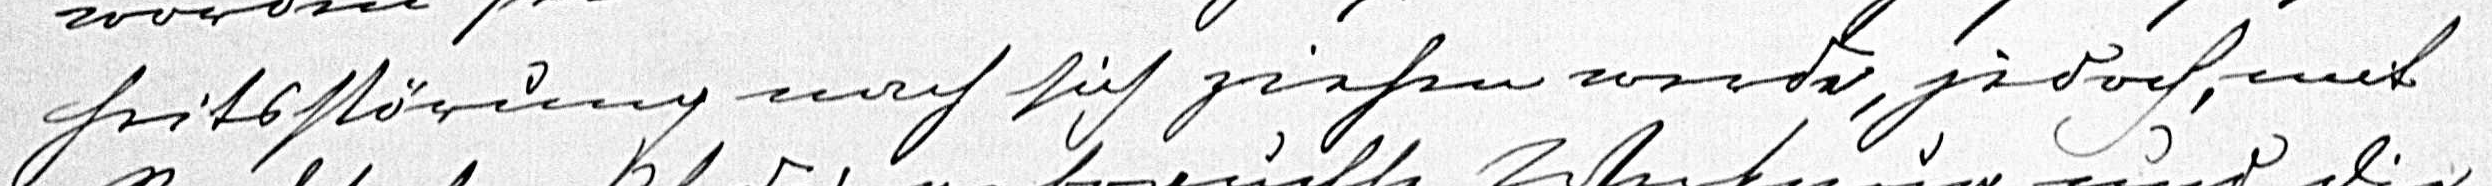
heitsstörung nach sich ziehen werde, jedoch, mit
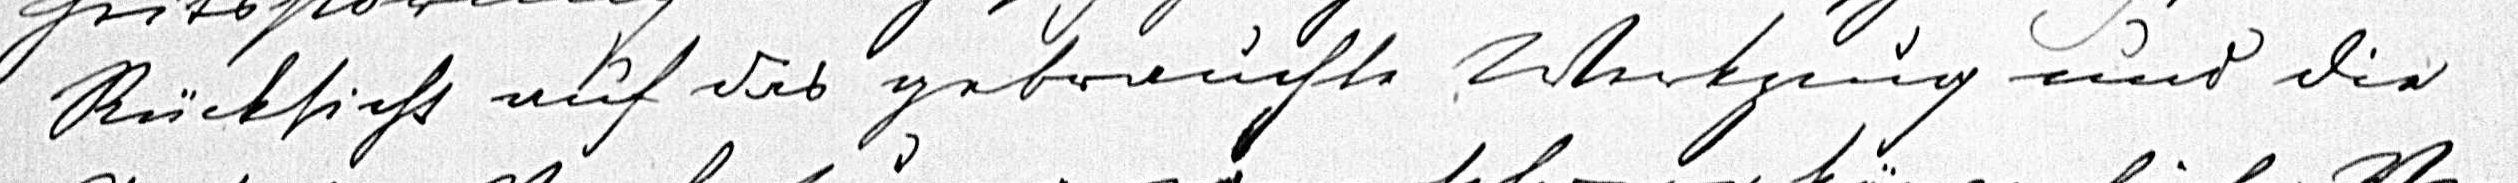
Rücksicht auf das gebrauchte Werkzeug und die
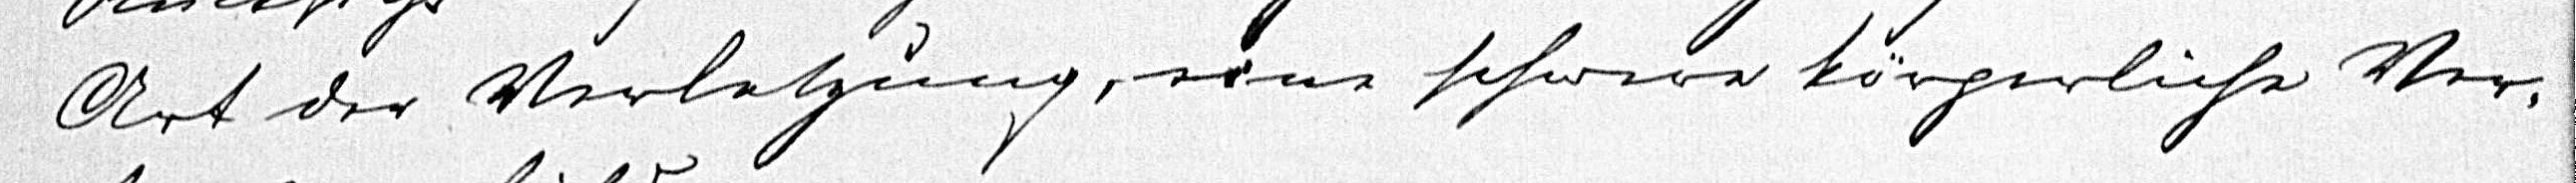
Art der Verletzung, eine schwere körperlich Ver¬
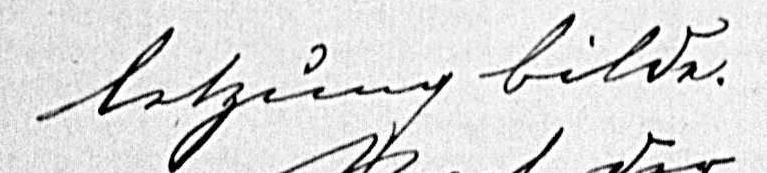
letzung bilde.
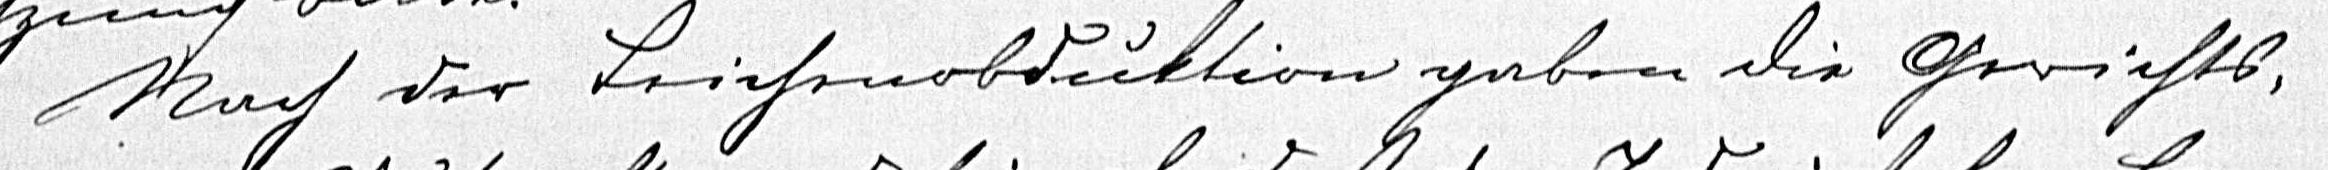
Nach der Leichenobduktion gaben die Gerichts¬
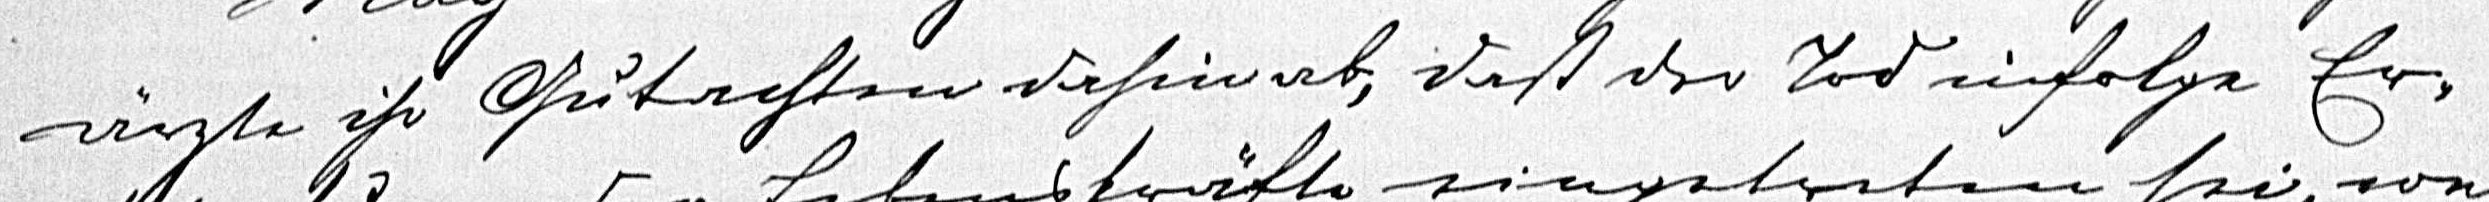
ärzte ihr Gutachten dahin ab, das der Tod infolge Er¬
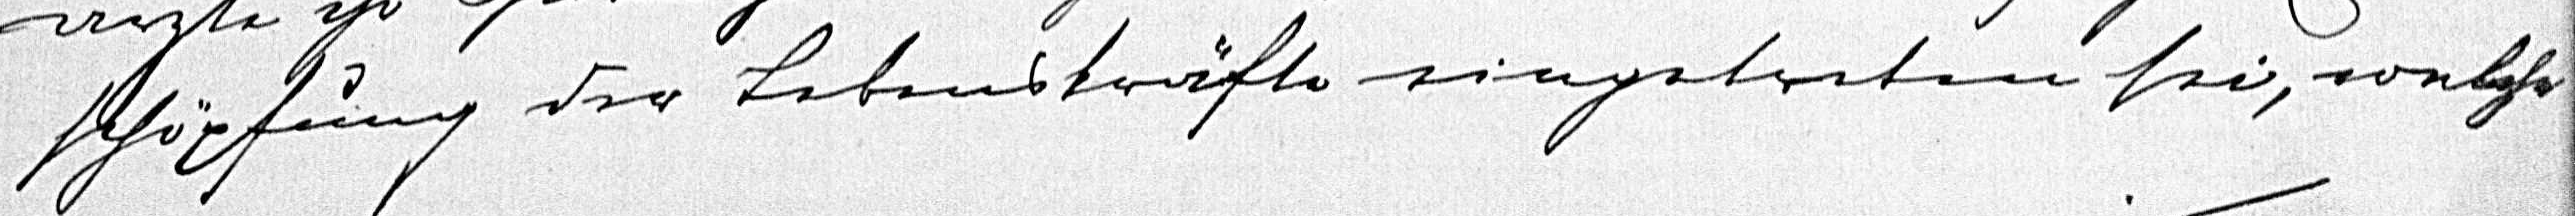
schöpfung der Lebenskräfte eingetreten sei, welche
